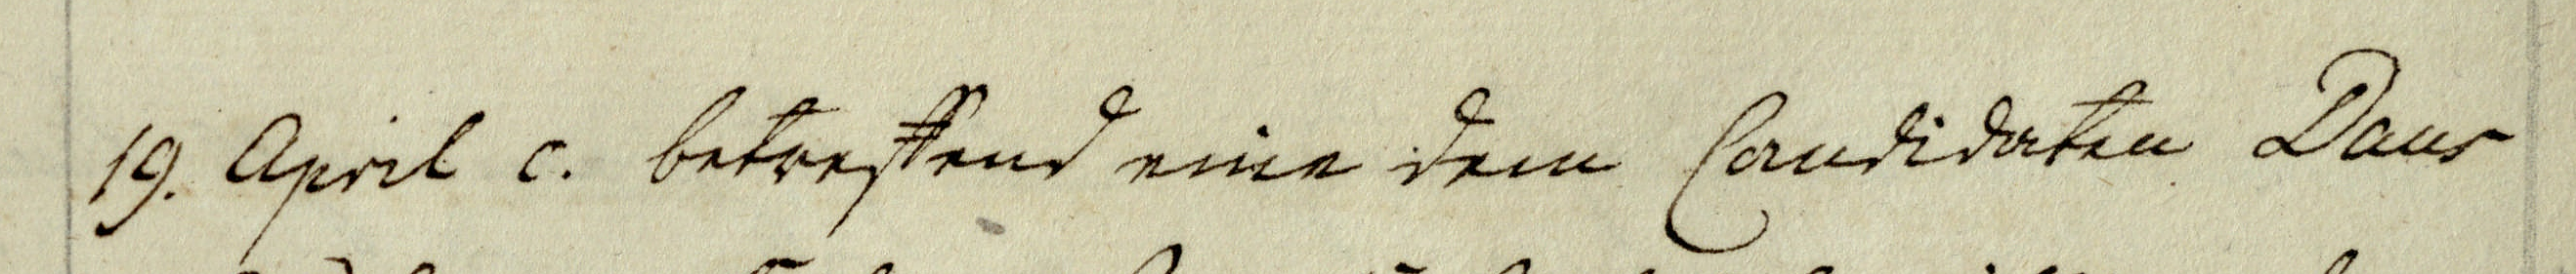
19. April c. betreffend eine dem Candidaten Daus
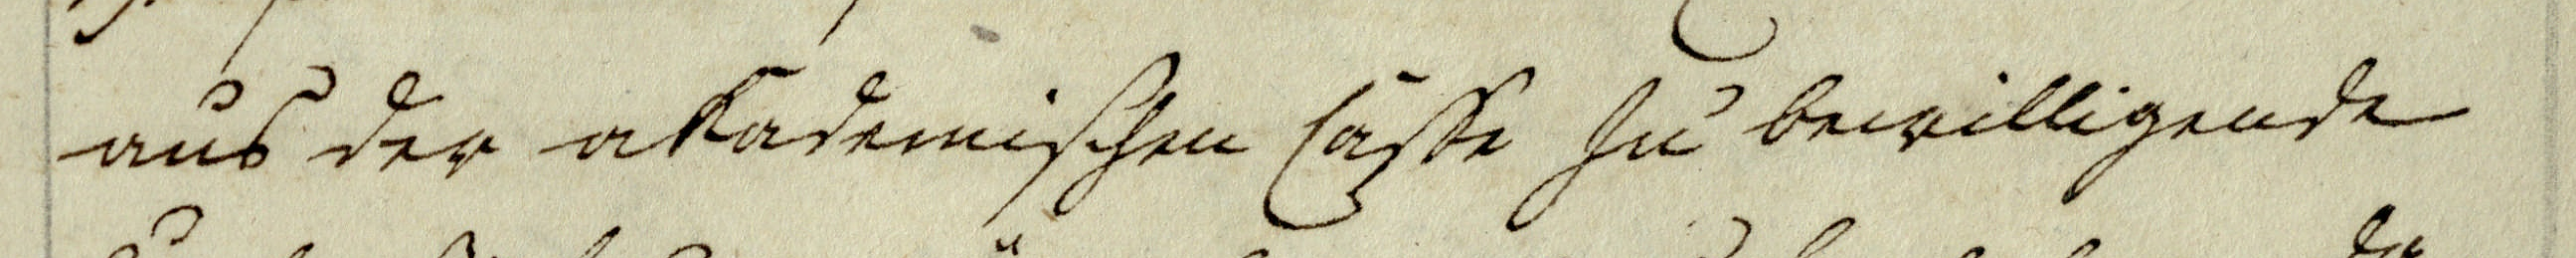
aus der akademischen Casse zu bewilligende
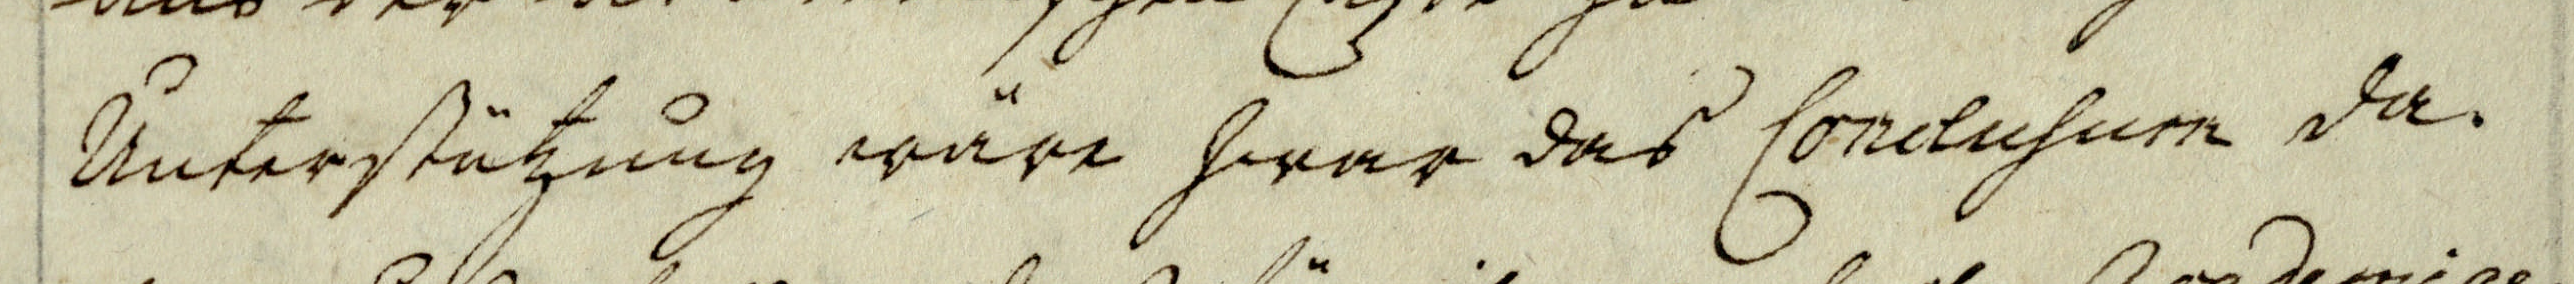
Unterstützung wäre zwar das Conclusum da¬
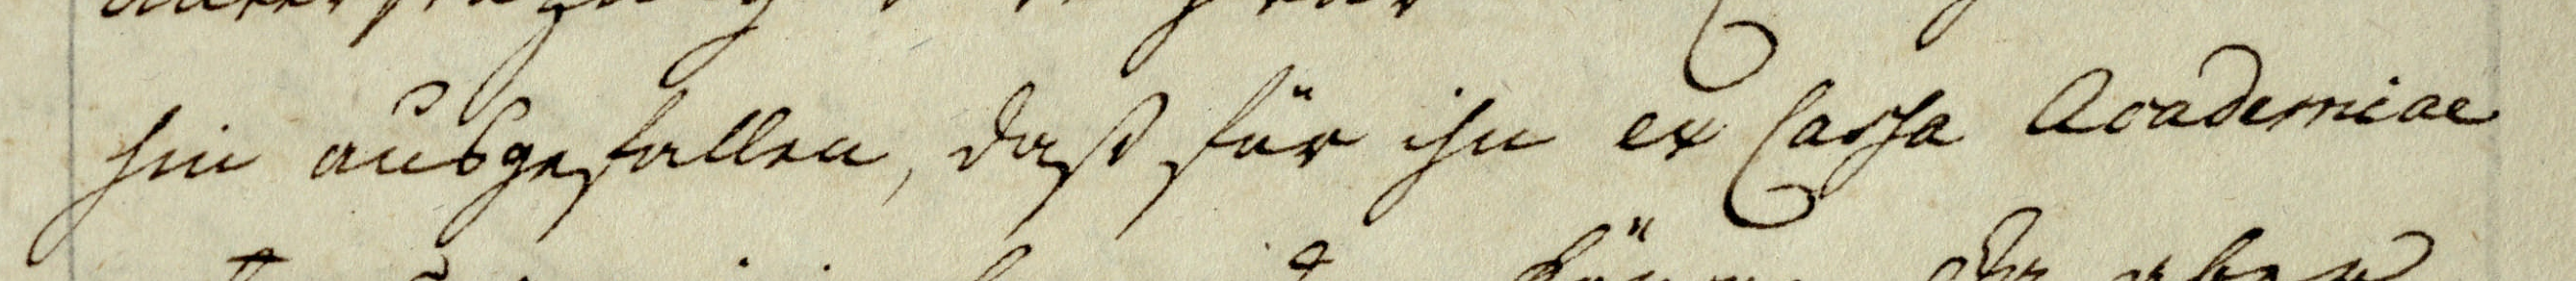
in ausgefallen, daß für ihn ex Cassa Academiae
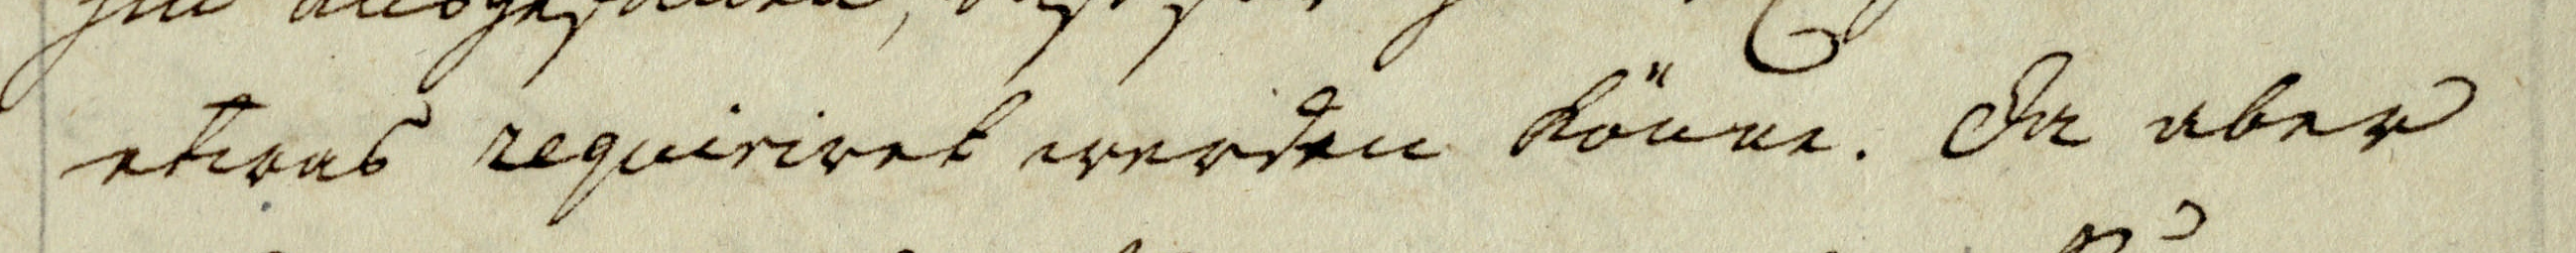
etwas requiriret werden könne. Da aber
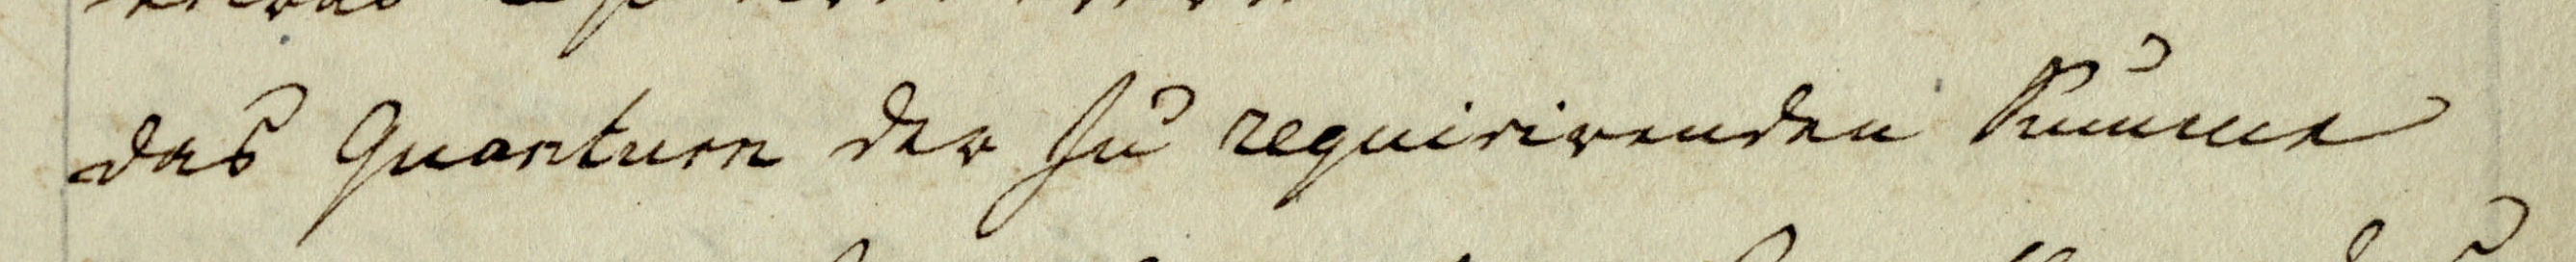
das Quantum der zu requirirenden Summe
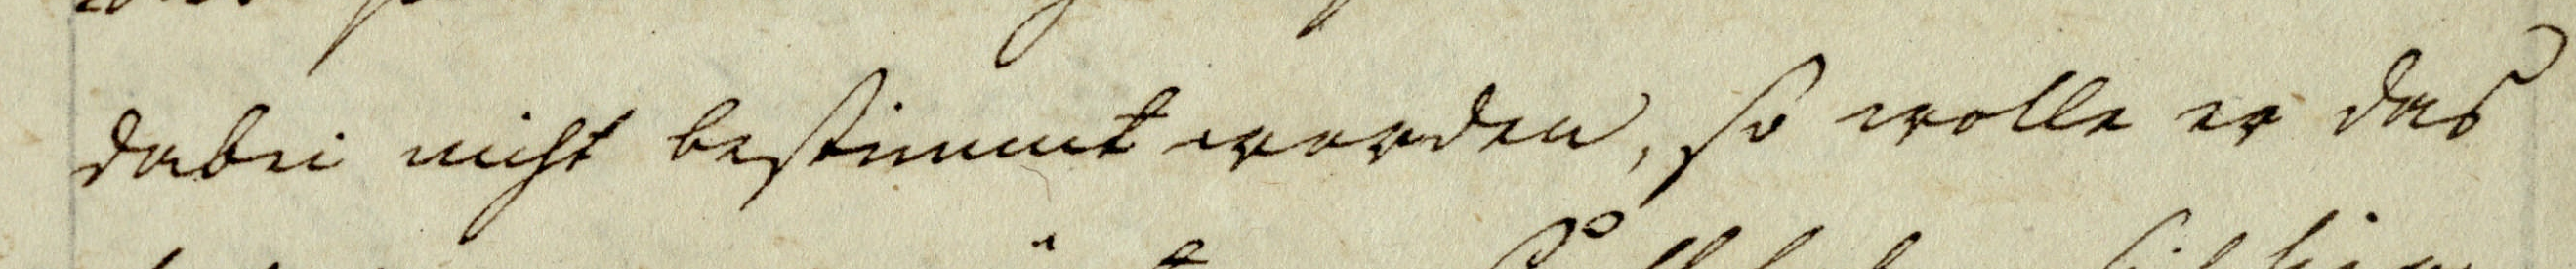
dabei nicht bestimmt worden, so wolle er das
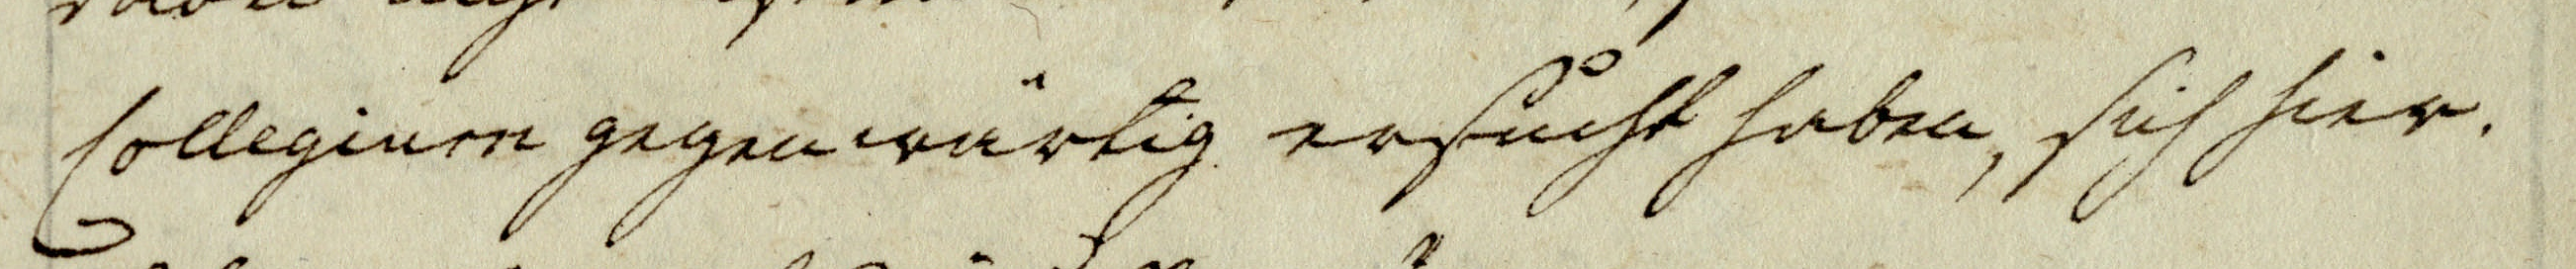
Collegium gegenwärtig ersucht haben, sich hier¬
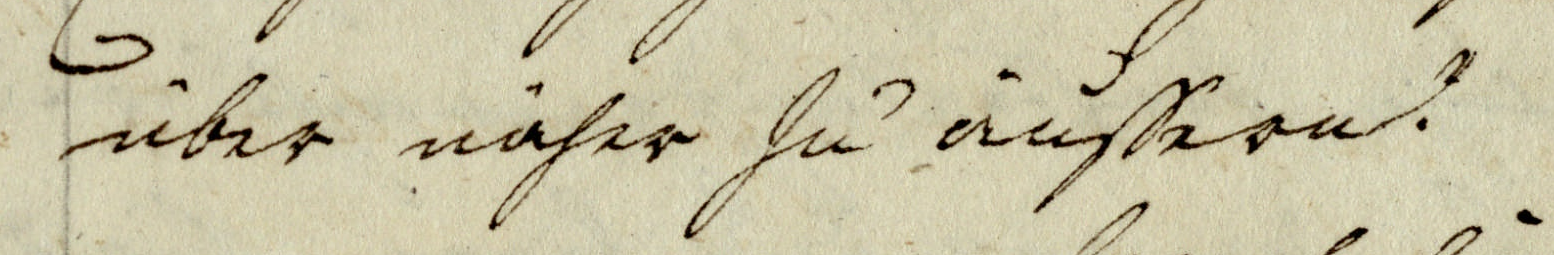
über näher zu äussern.
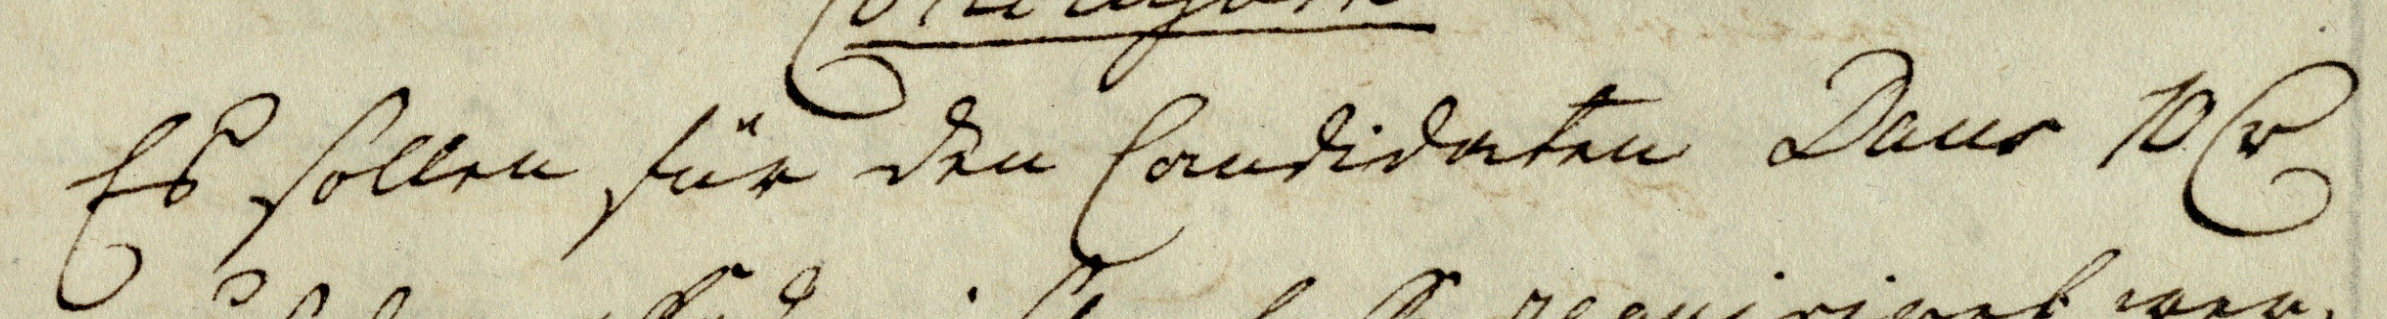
Es sollen für den Candidaten Daus 10 l.
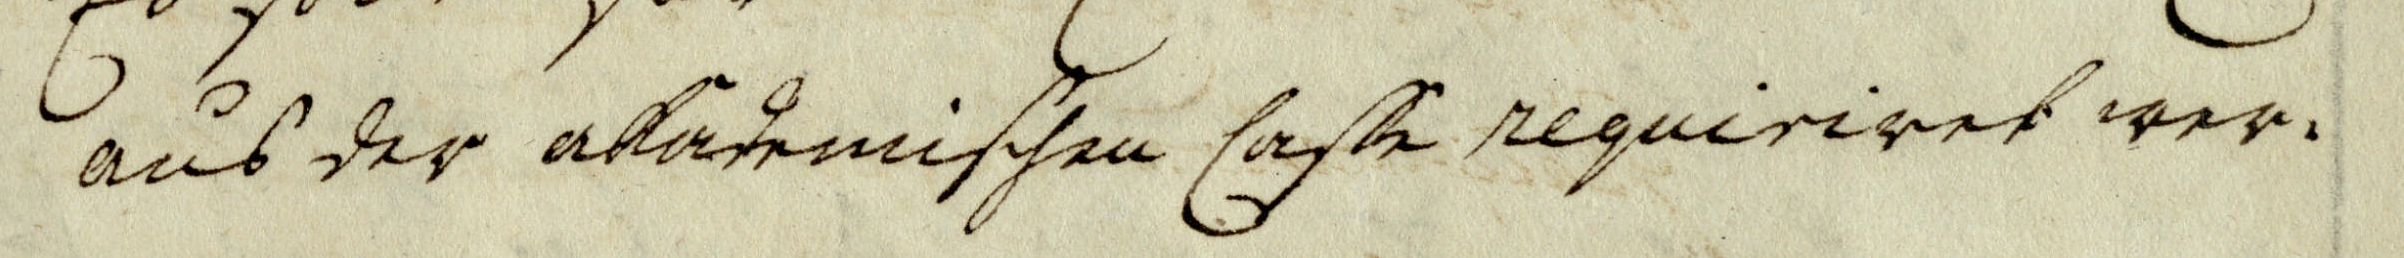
aus der akademischen Casse requiriret wer¬
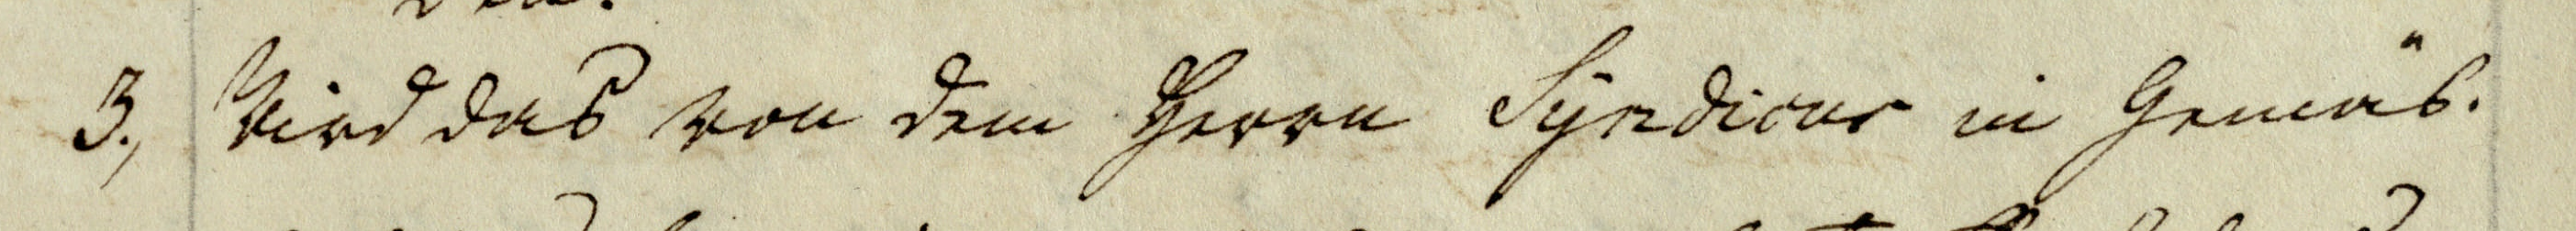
3., Wird das von dem Herrn Sÿndicus in Gemäs¬
